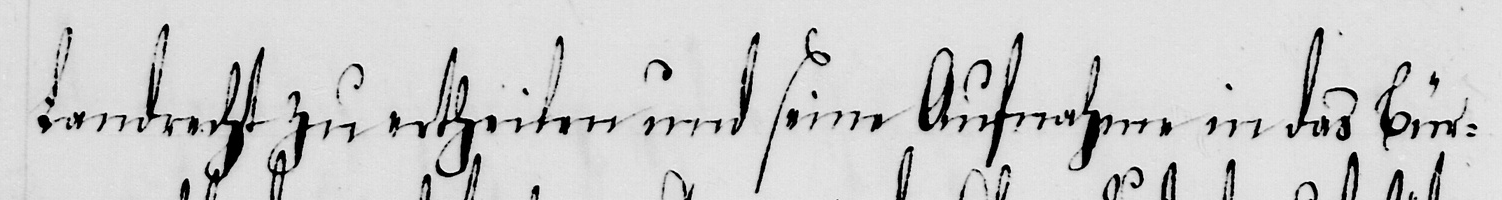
Landrecht zu ertheilen und seine Aufnahme in das Bür¬
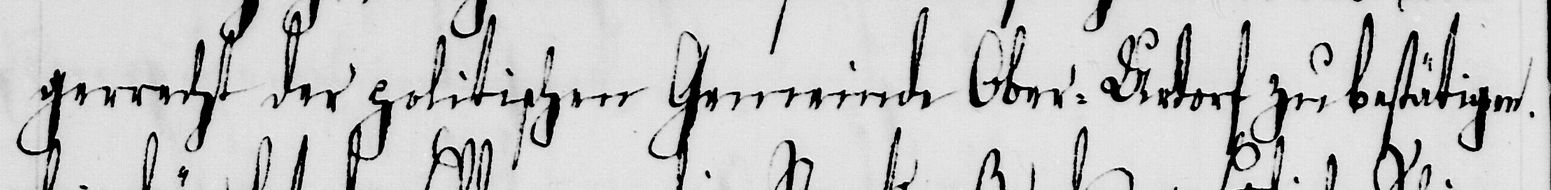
gerrecht der politischen Gemeinde Ober-Urdorf zu bestätige¬
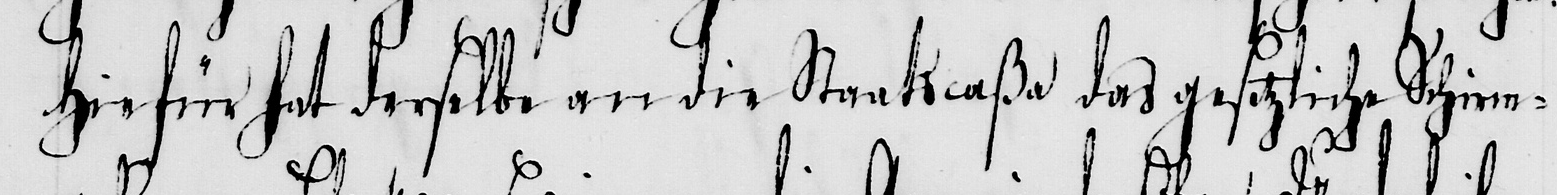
Hiefür hat derselbe an die Staatscaßa das gesetzliche Schir¬
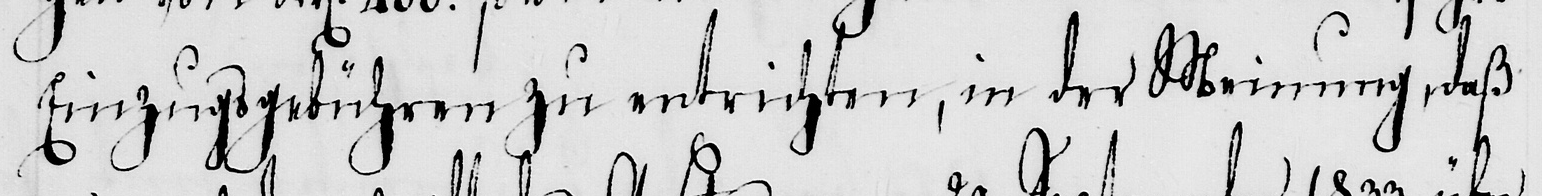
Einzugsgebühren zu entrichten, in der Meinung, daß
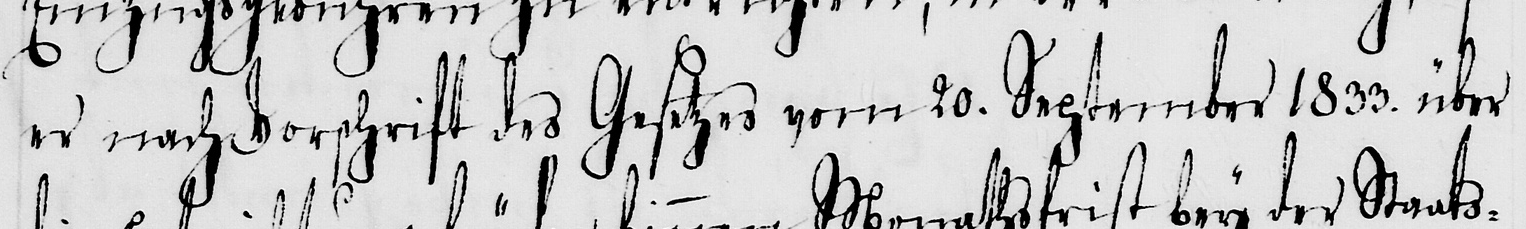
er nach Vorschrift des Gesetzes vom 20. September 1833. über
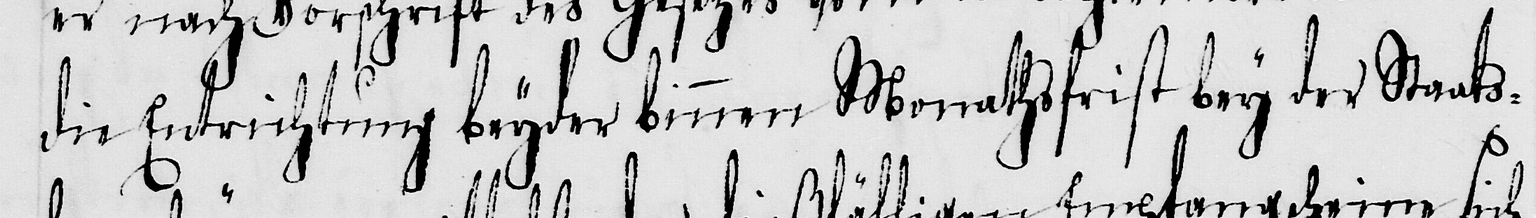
die Entrichtung beyder binnen Monathsfrist bey der Staats¬
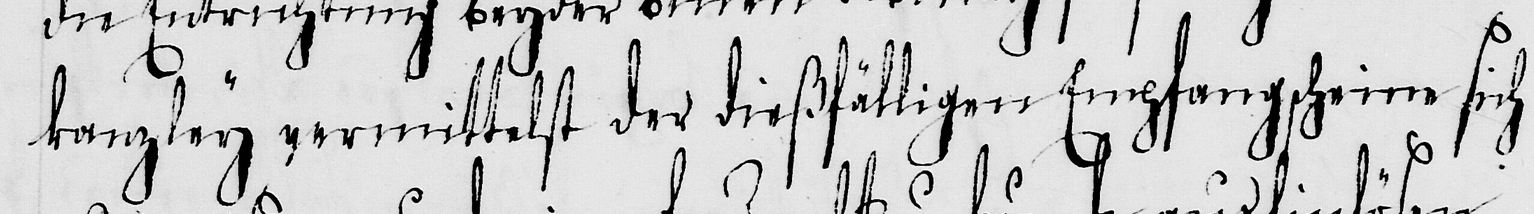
kanzley vermittelst der dießfälligen Empfangscheine sich
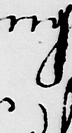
n.
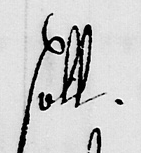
l.
